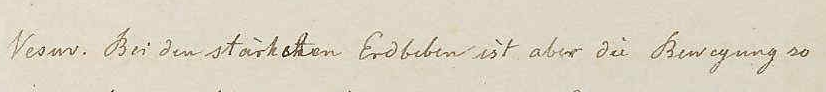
Vesuv. Bei den stärkersten Erdbeben ist aber die Bewegung so
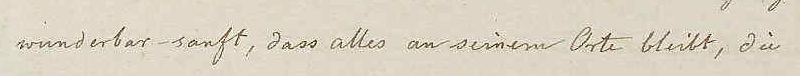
wunderbar sanft, dass alles an seinem Orte bleibt, die
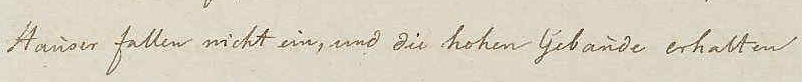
Häuser fallen nicht ein, und die hohen Gebäude erhalten
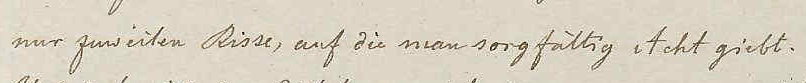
nur zuweilen Risse, auf die man sorgfältig Acht giebt.
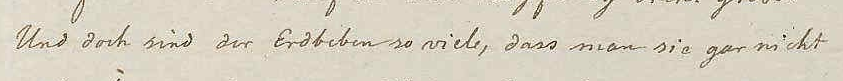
Und doch sind der Erdbeben so viele, dass man sie gar nicht
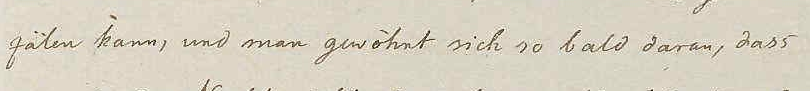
zälen kann, und man gewöhnt sich so bald daran, dass
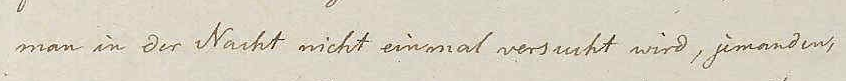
man in der Nacht nicht einmal versucht wird, jemanden,
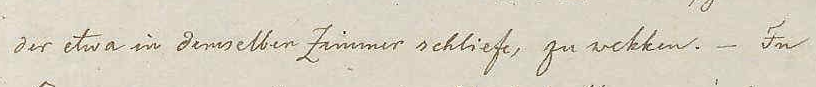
der etwa in demselben Zimmer schliefe, zu wekken. – In
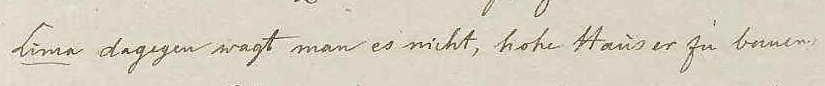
Lima dagegen wagt man es nicht, hohe Häuser er zu bauen,
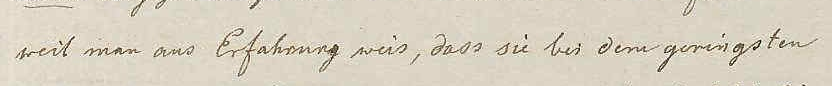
weil man aus Erfahrung weis, dass sie bis dem geringsten
